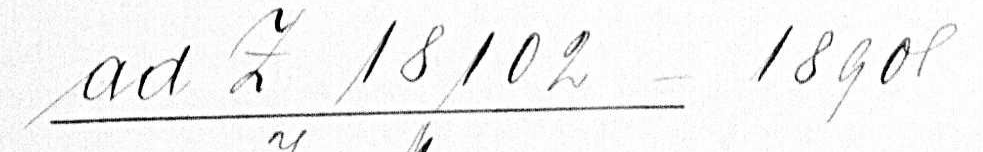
ad Z 18102 - 18904
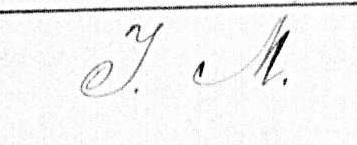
J. M.
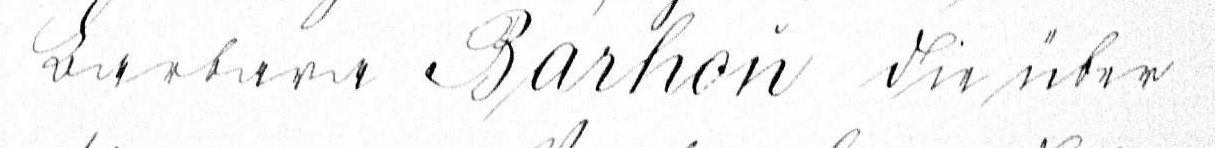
Barbara Barhxx die über
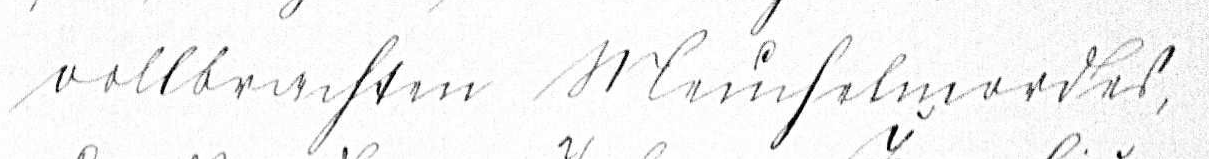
vollbrachten Meuchelmordes,
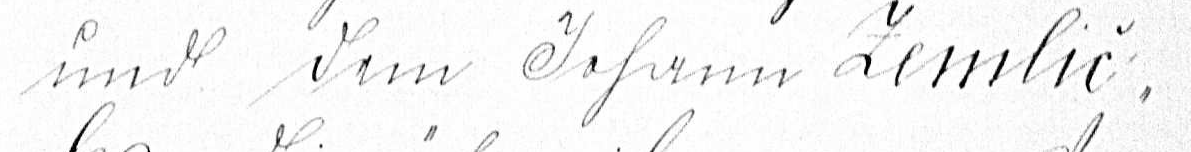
und dem Johann Žemlič¬
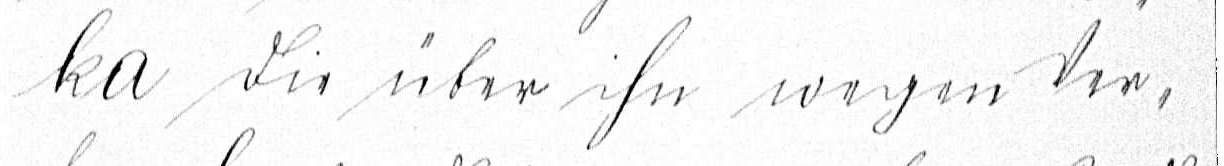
ka die über ihn wegen Ver¬
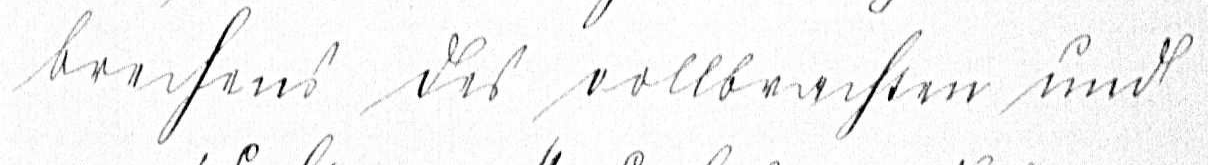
brechens des vollbrachten und
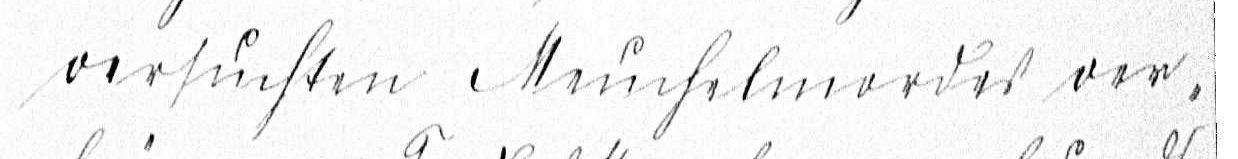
versuchten Meuchelmordes ver¬
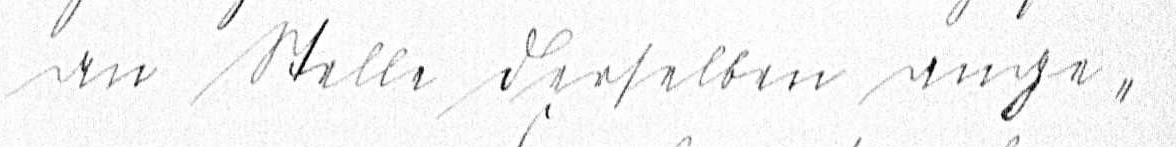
an Stelle derselben ange¬
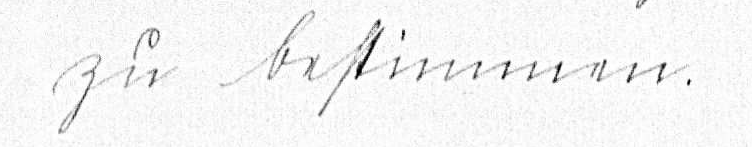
zu bestimmen.
